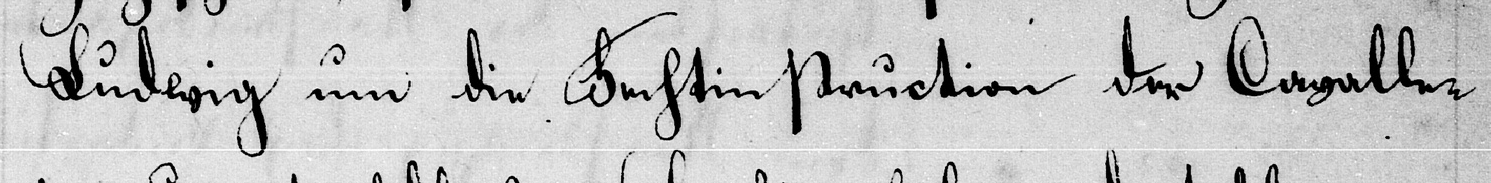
Ludwig um die Fechtinstruction der Cavalle¬
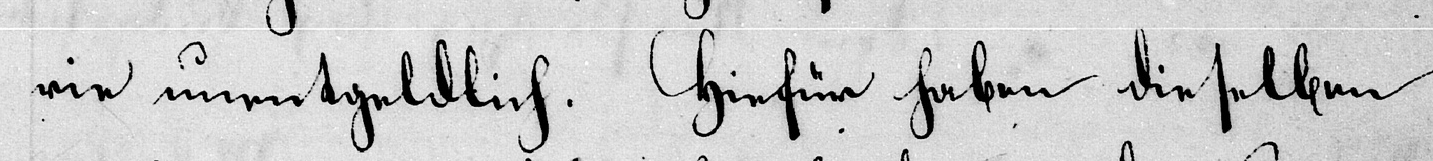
rie unentgeldlich. Hiefür haben dieselben
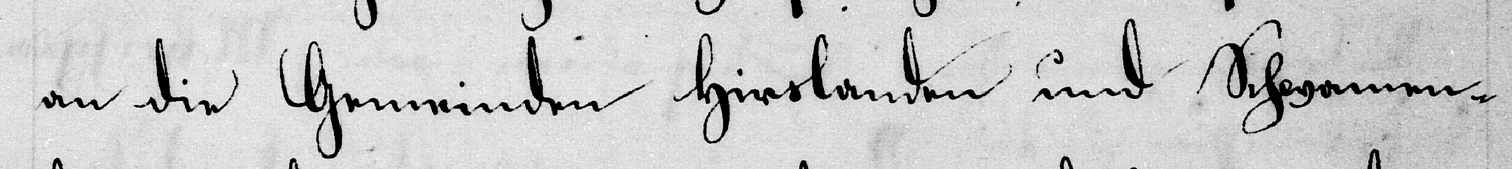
an die Gemeinden Hirslanden und Schwamen¬
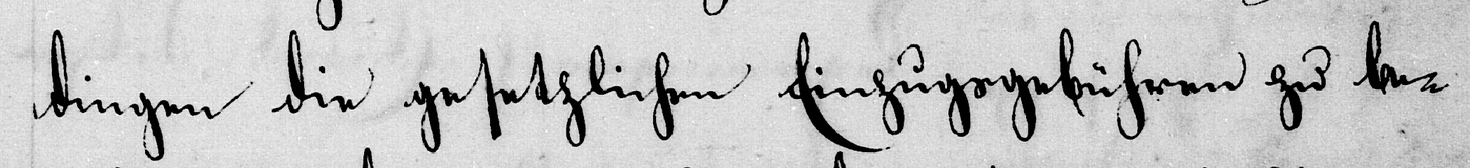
dingen die gesetzlichen Einzugsgebühren zu be¬
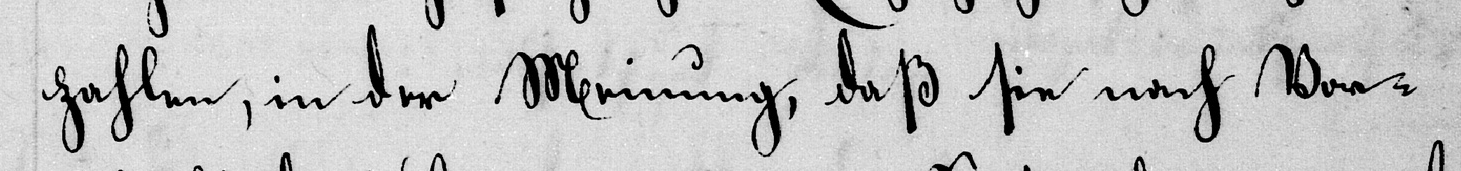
zahlen, in der Meinung, daß sie nach Vor¬
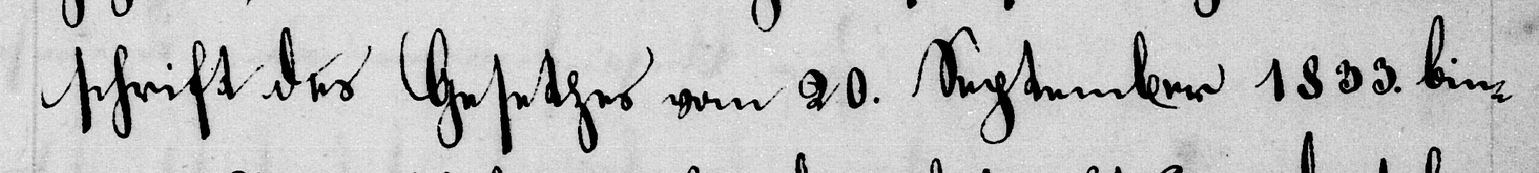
schrift des Gesetzes vom 20. September 1833. bin¬
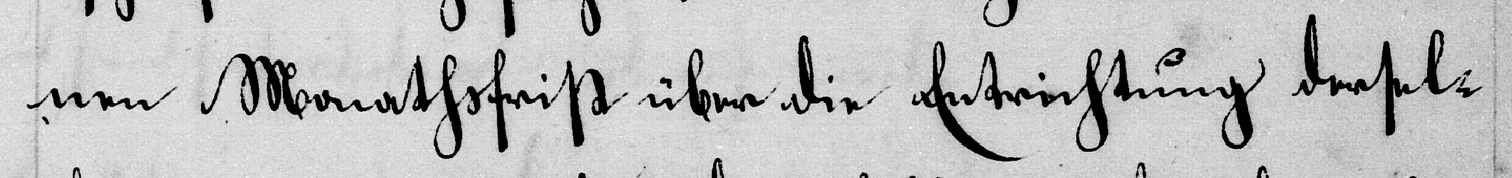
nen Monathsfrist über die Entrichtung dersel¬
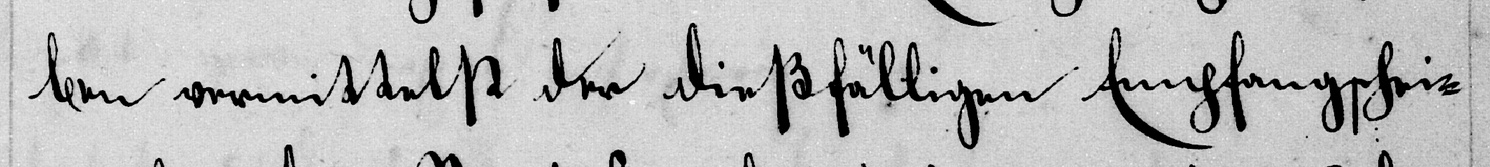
ben vermittelst der dießfälligen Empfangschei¬
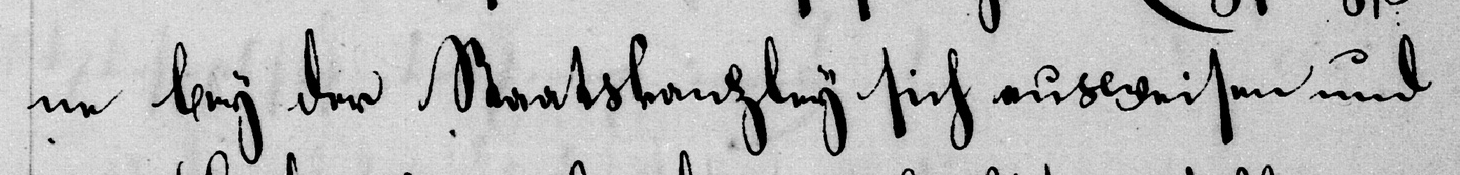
ne bey der Staatskanzley sich ausweisen und
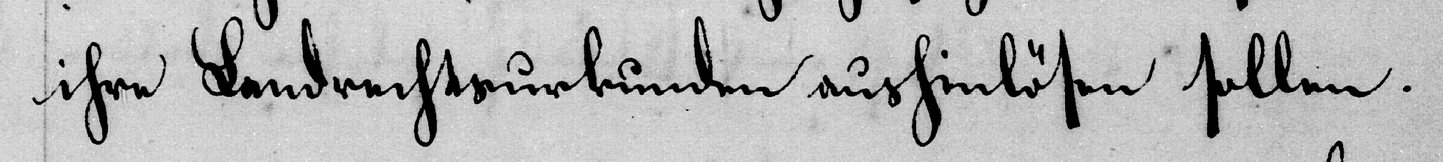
ihre Landrechtsurkunden aushinlösen sollen.
